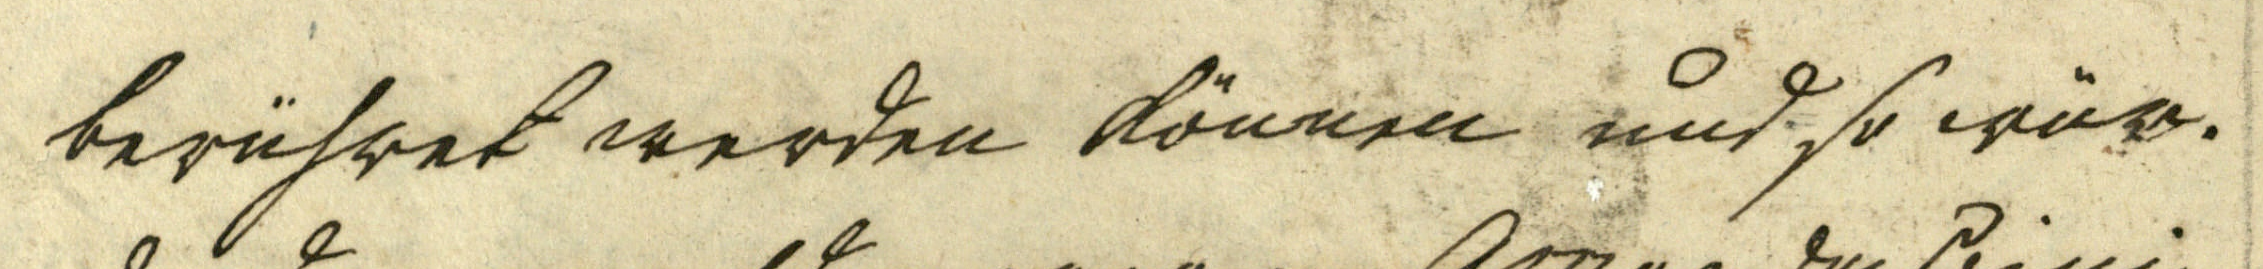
berühret werden können und so wür¬
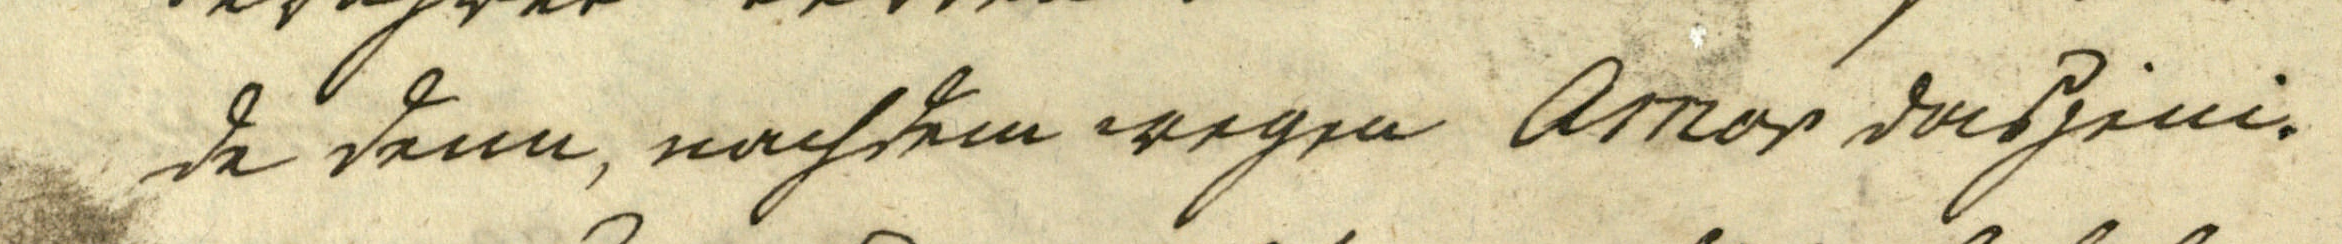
de denn, nachdem wegen Amor dasjeni¬
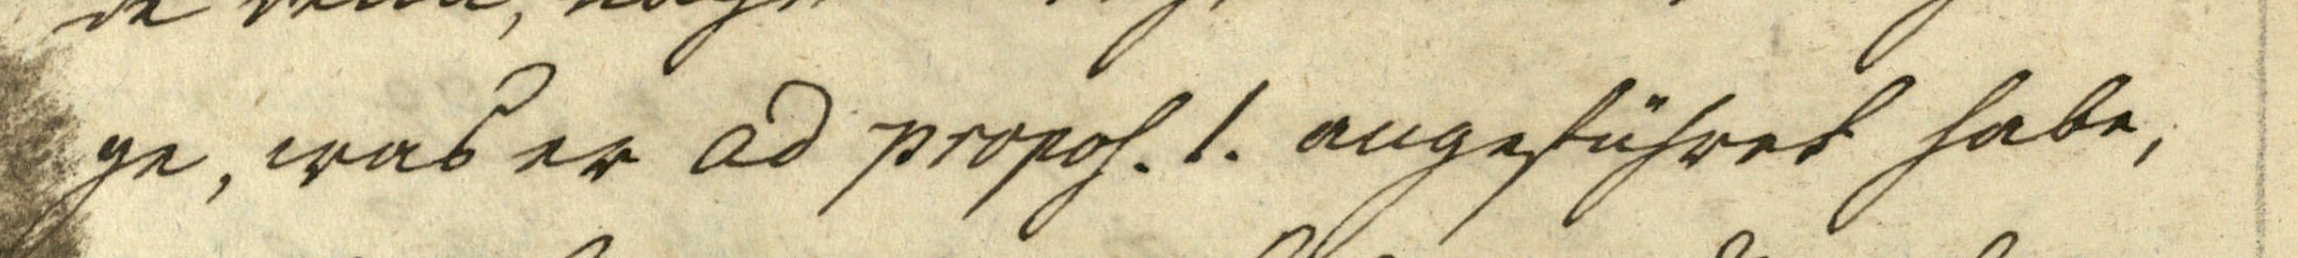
ge, was er ad propos. 1. angeführet habe,
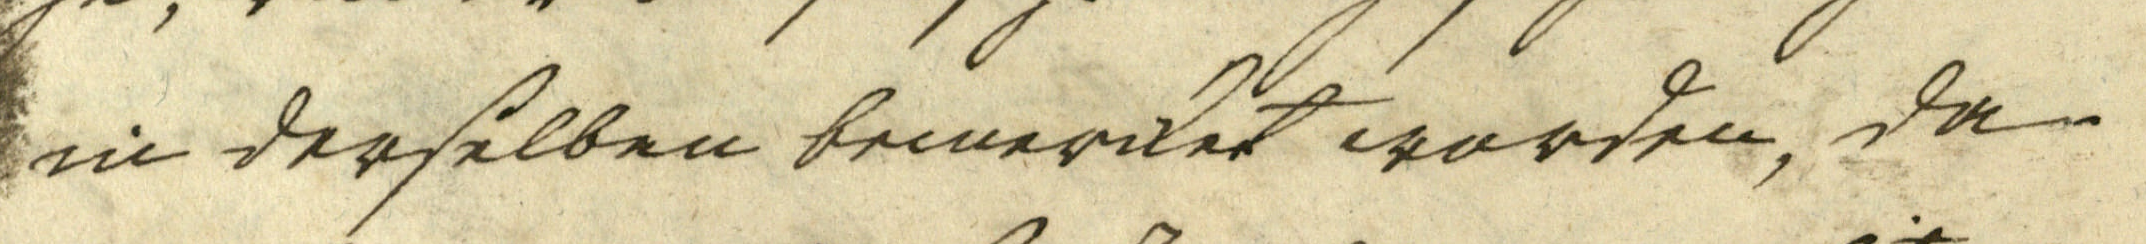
in derselben bemercket worden, da
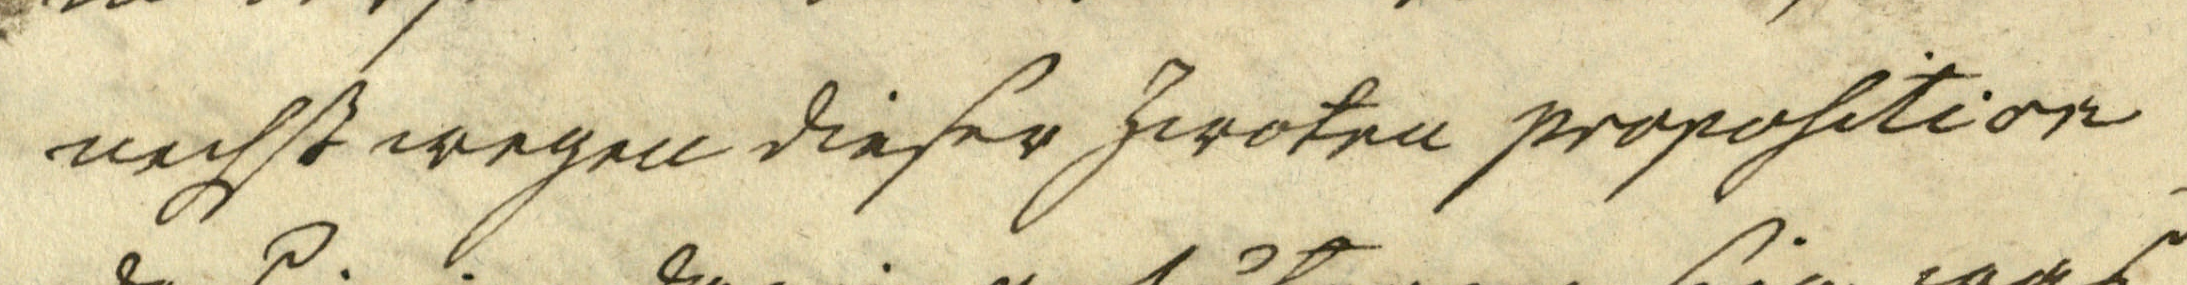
nechst wegen dieser zwoten proposition
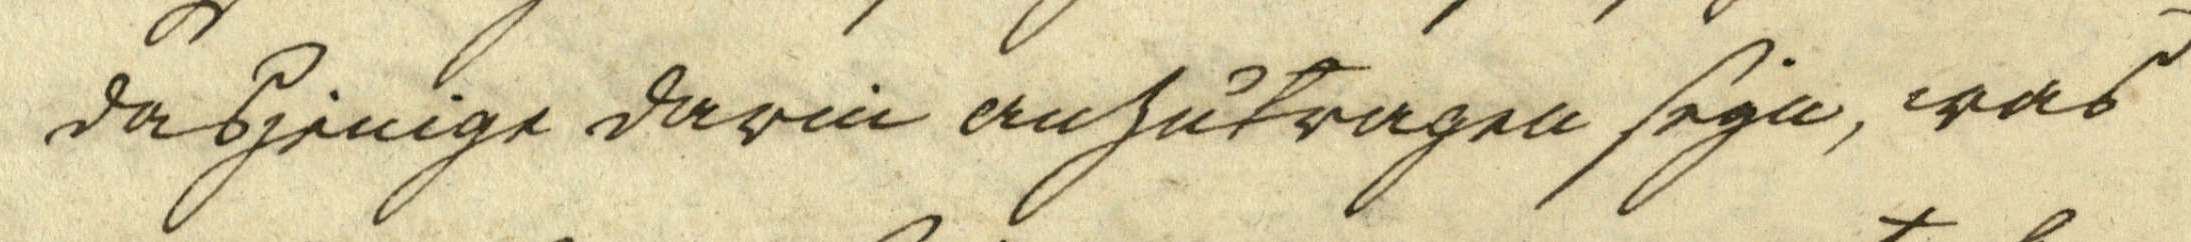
dasjenige darin anzutragen seÿn, was
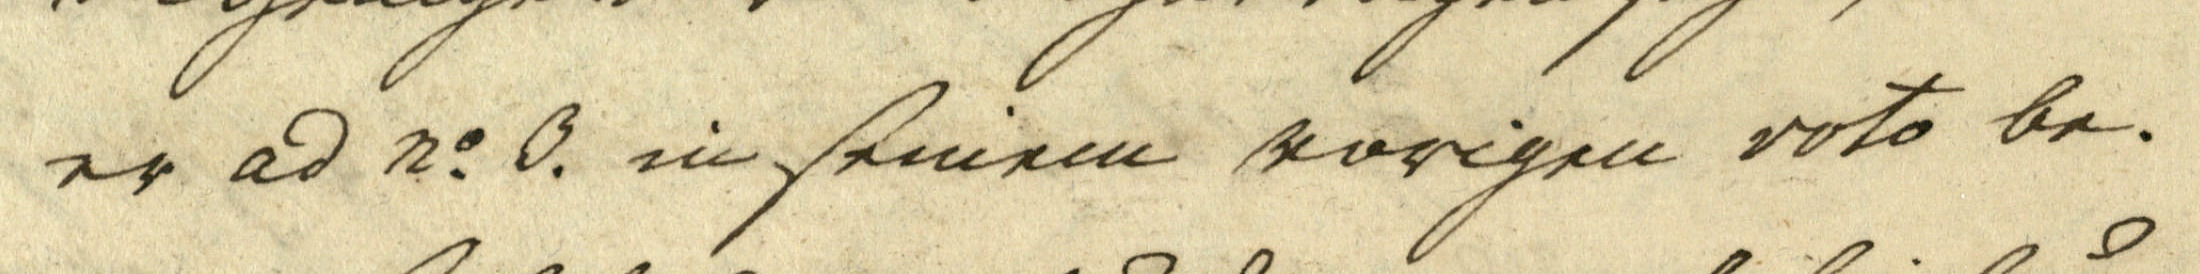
er ad no. 3. in seinem vorigen voto be¬
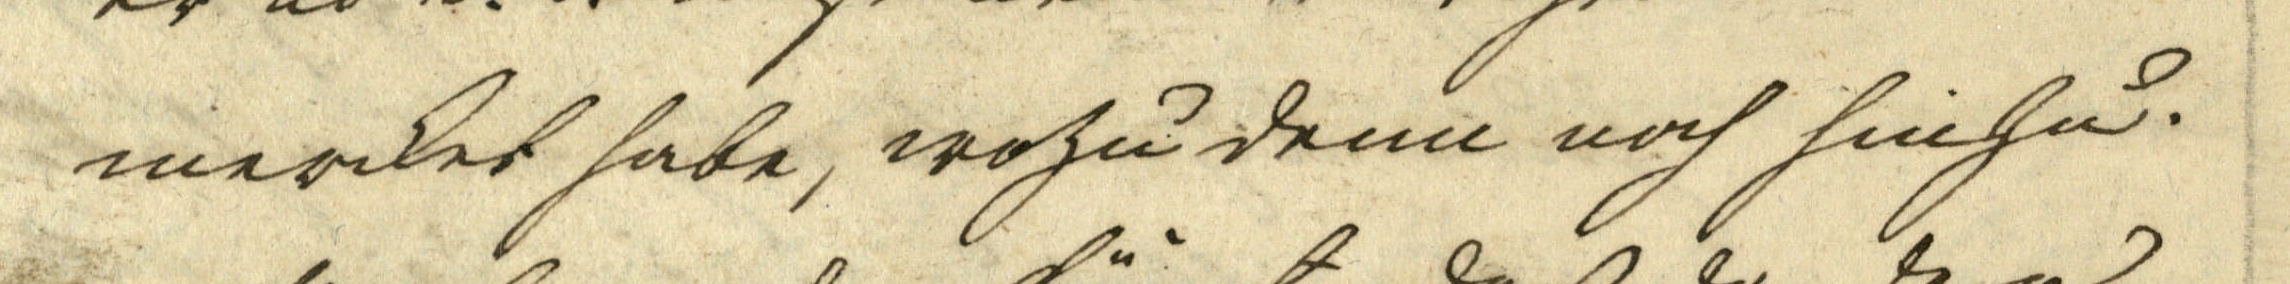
mercket habe, wozu denn noch hinzu¬
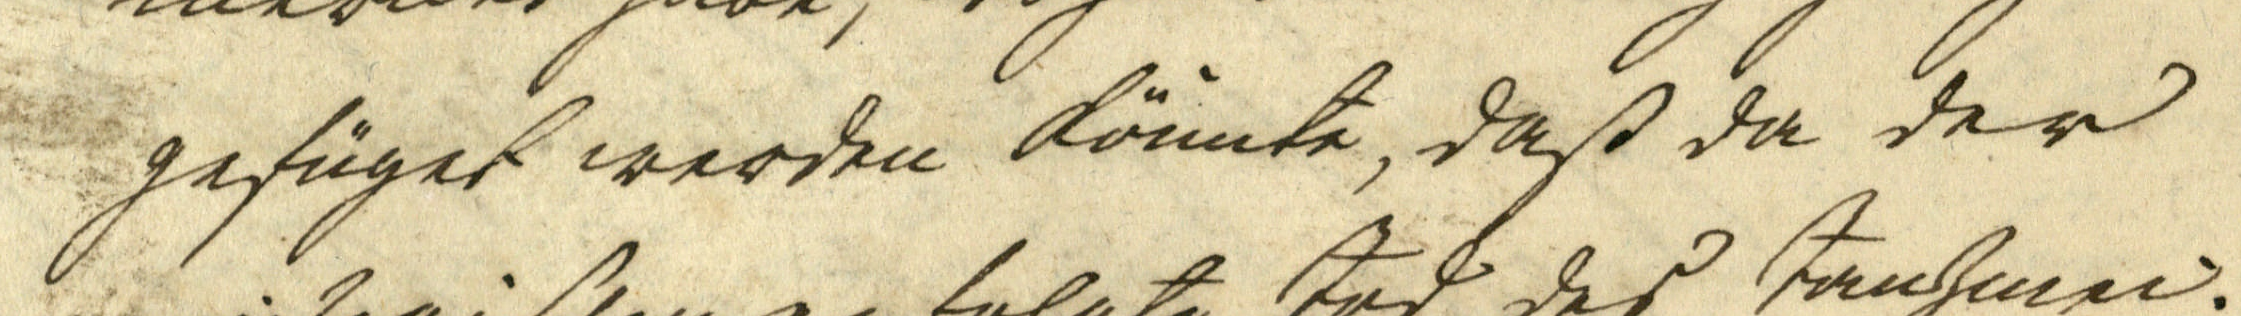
gefüget werden könnte, daß da der
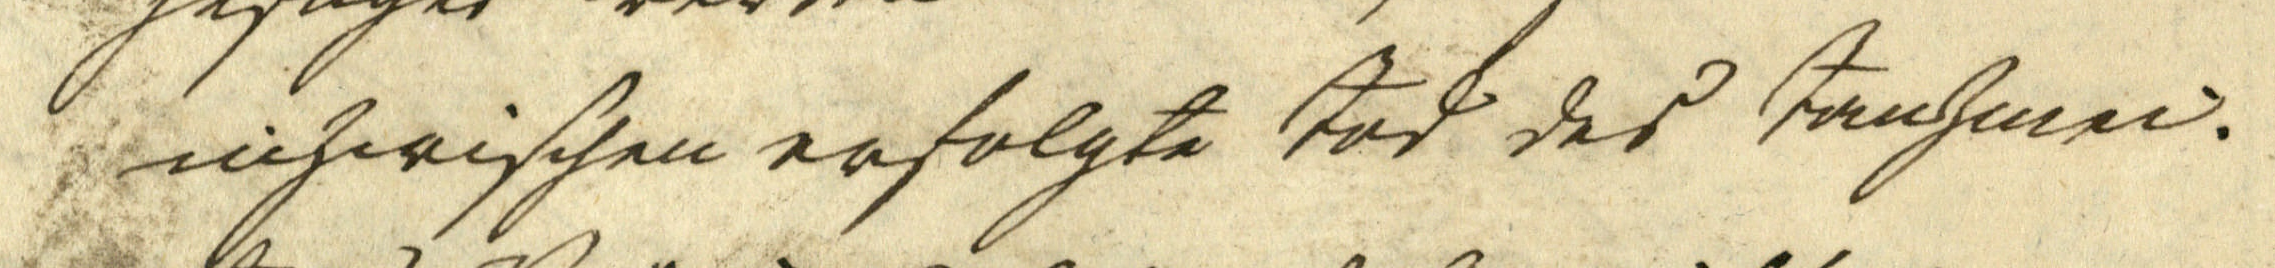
inzwischen erfolgte Tod des Tanzmei¬
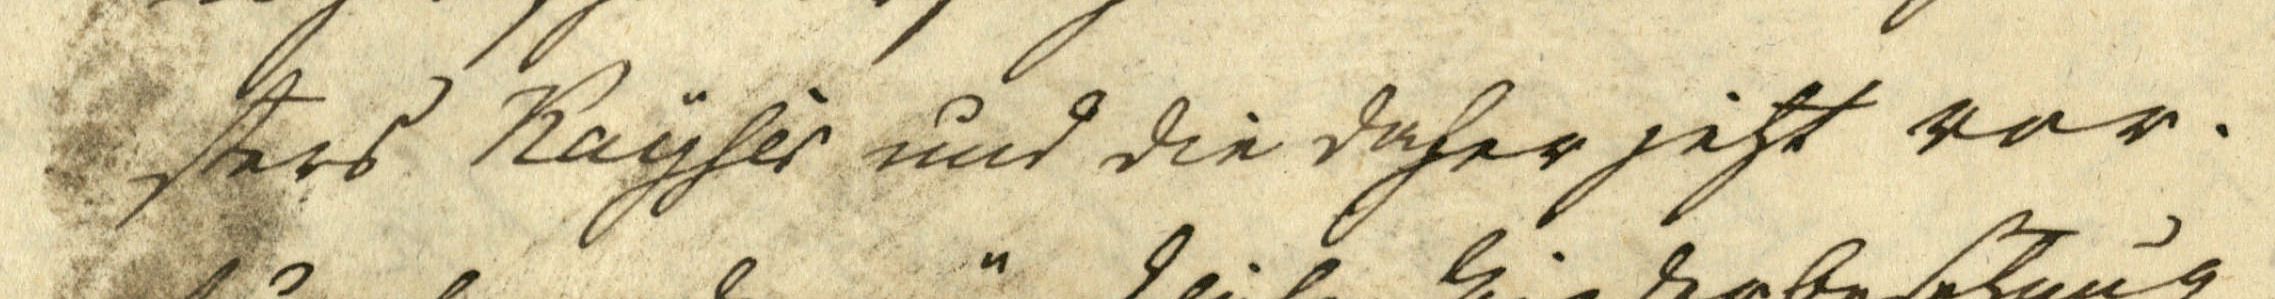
sters Kaÿser und die daher jetzt vor¬
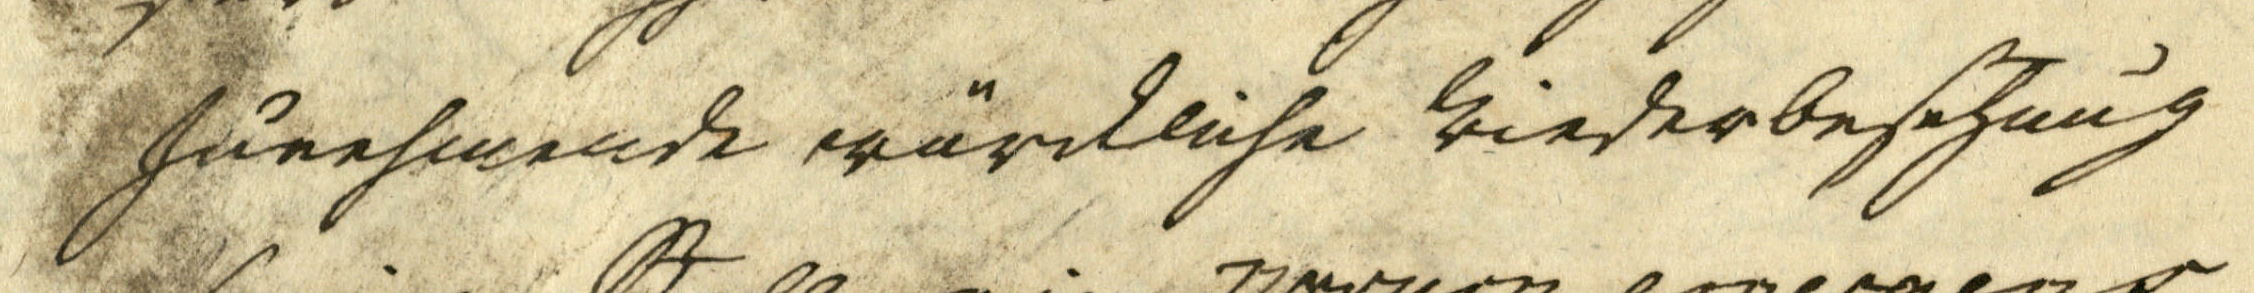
zunehmende würkliche Wiederbesetzung
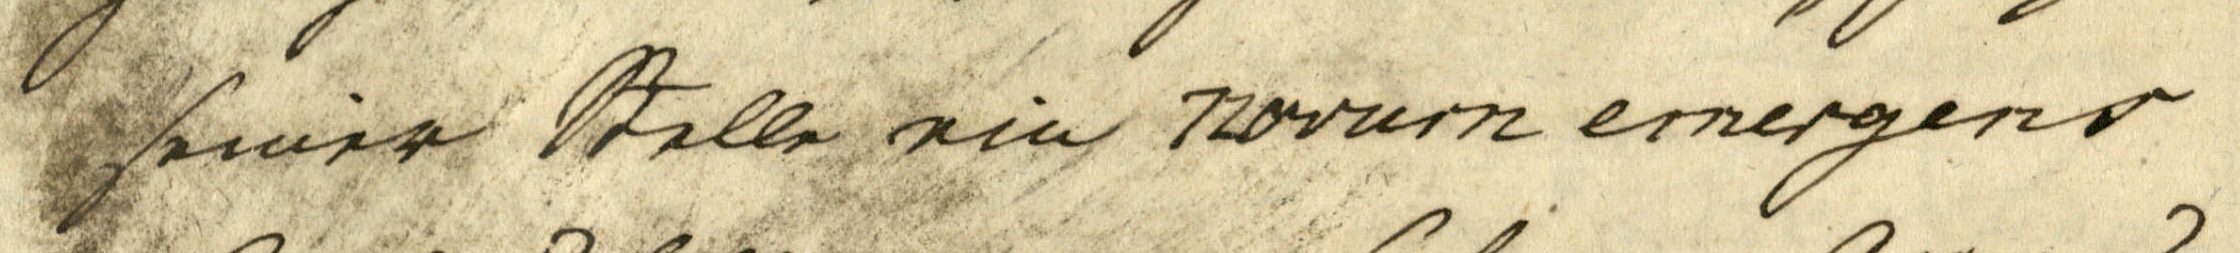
seiner Stelle ein novum emergens
